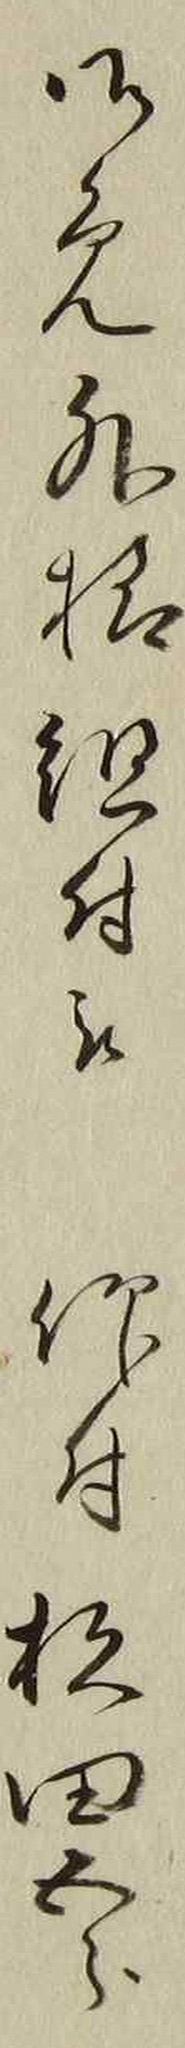御免外様組付被仰付杉田五郎
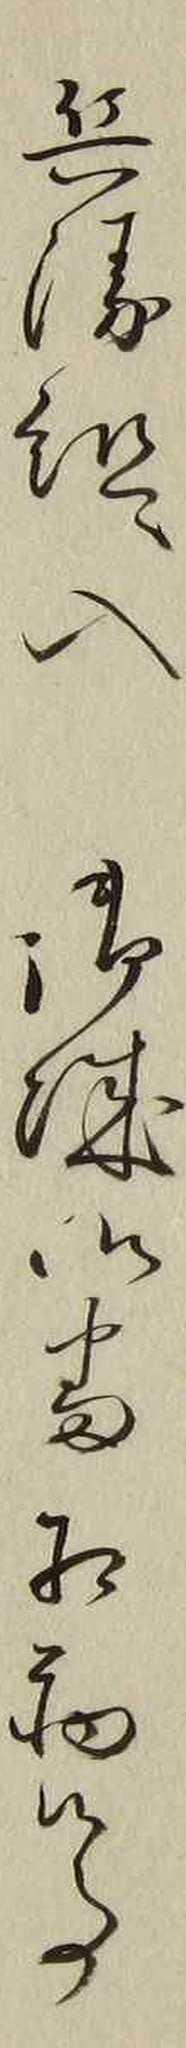兵衛組へ入御城御番相勤候事
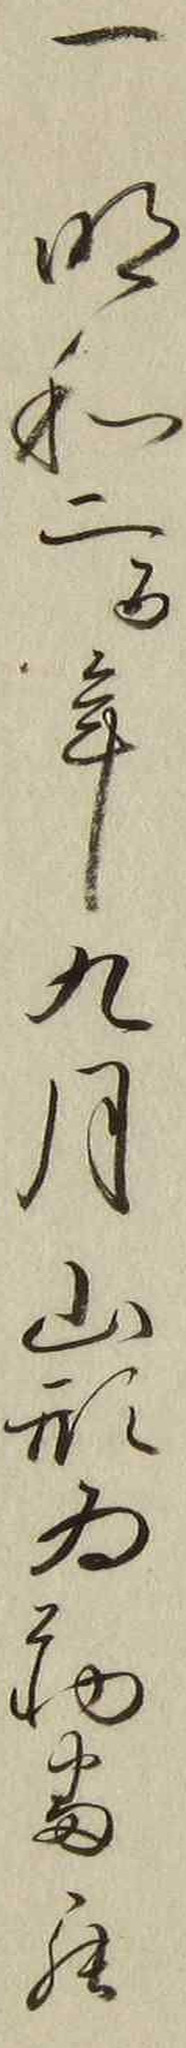一明和二酉年九月山形為勤番罷
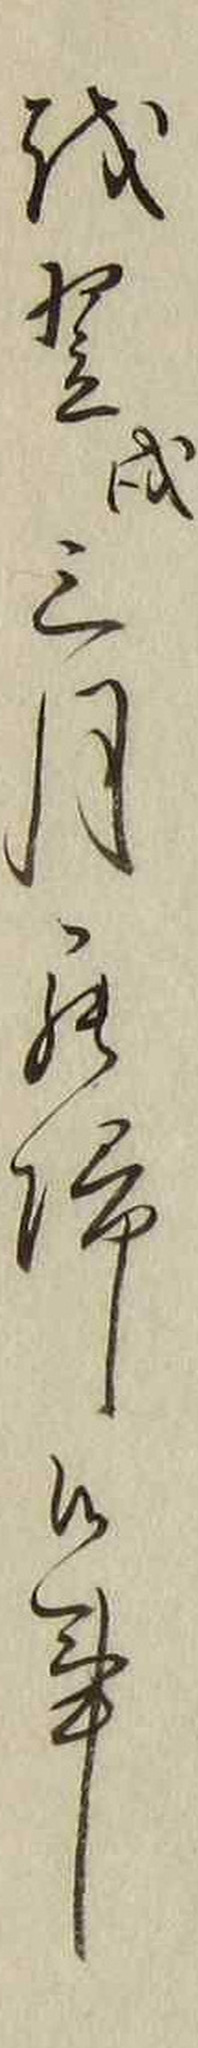越翌戌三月罷帰候事

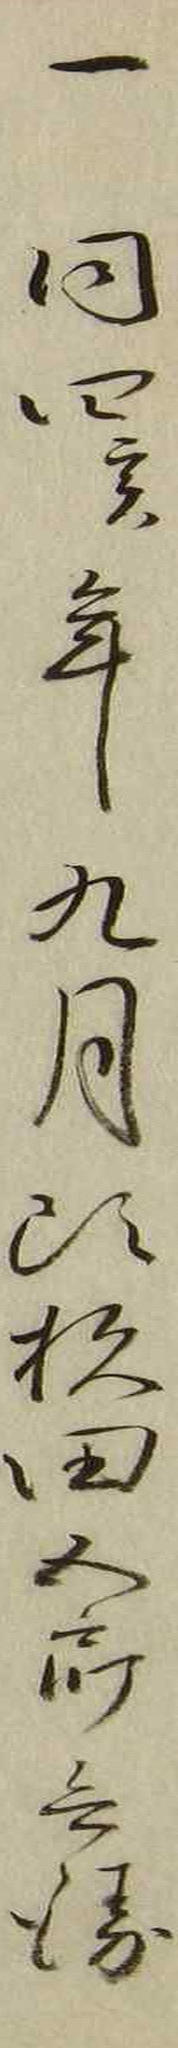一同四亥年九月頭杉田五郎兵衛
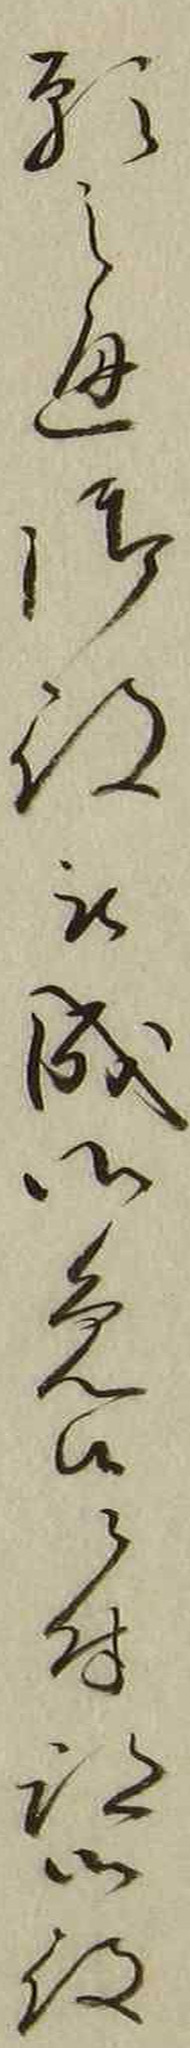願之通御役被成御免候二付跡御役
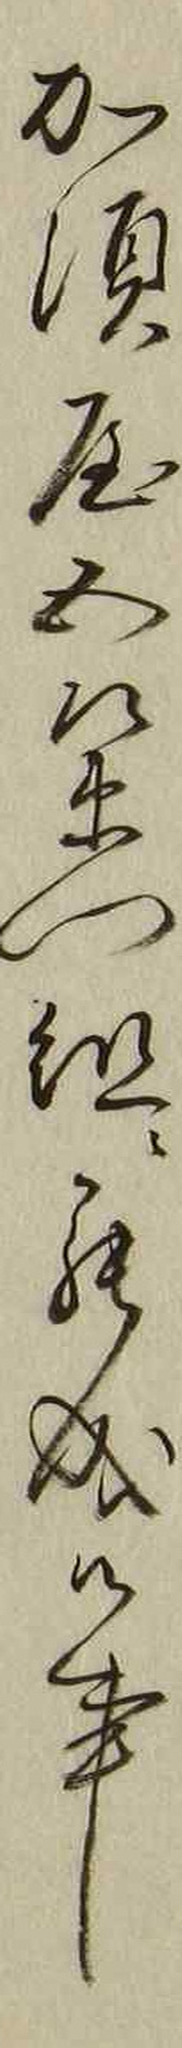加須屋五左衛門組に罷成候事
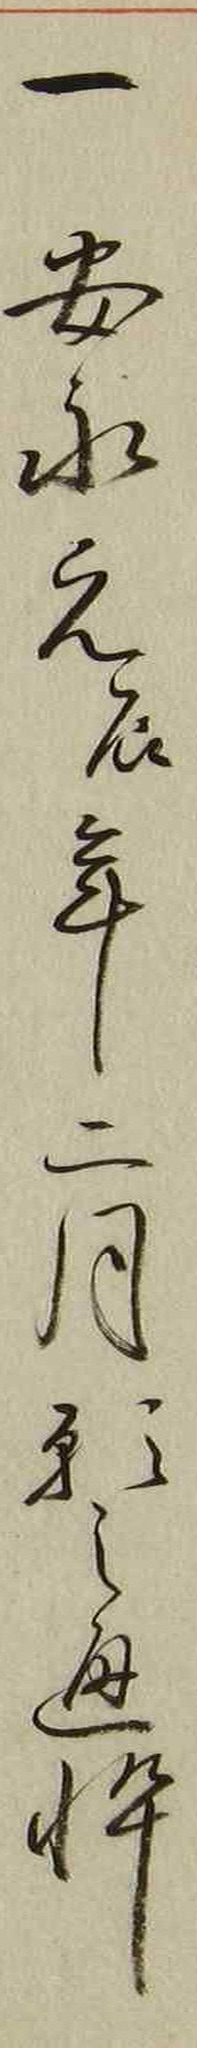一安永元辰年二月願之通忰
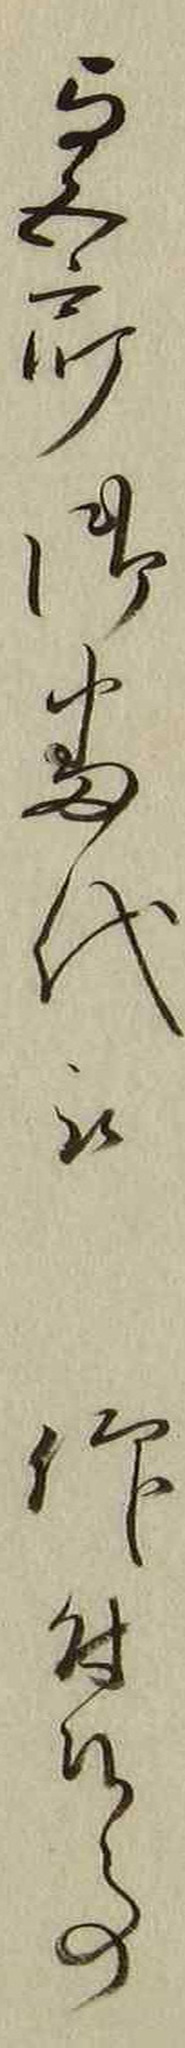与五郎御番代被仰付候事
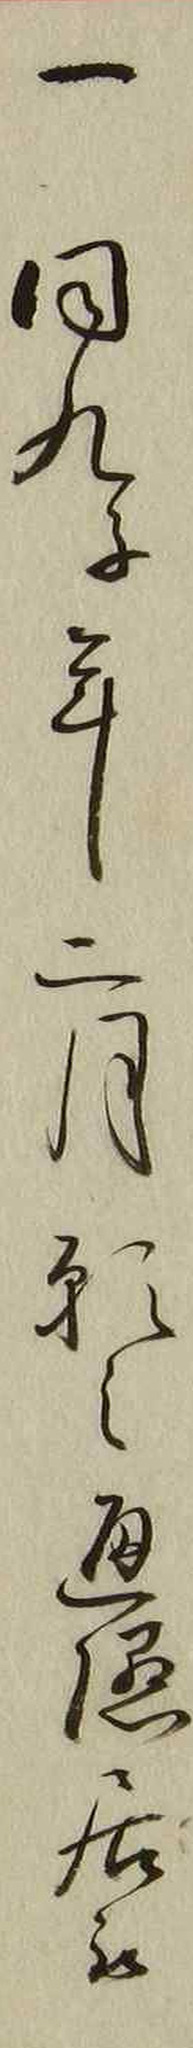一同九子年二月願之通隠居被
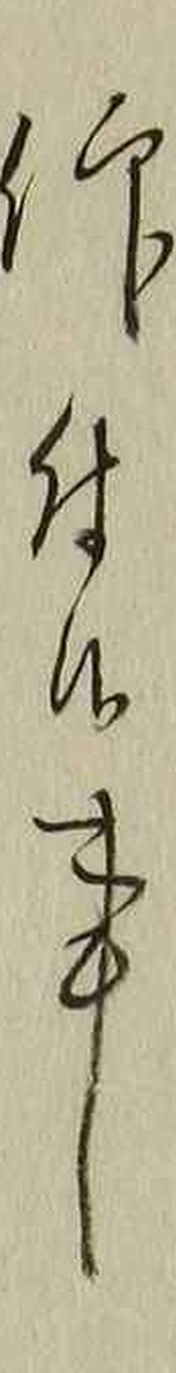仰付候事
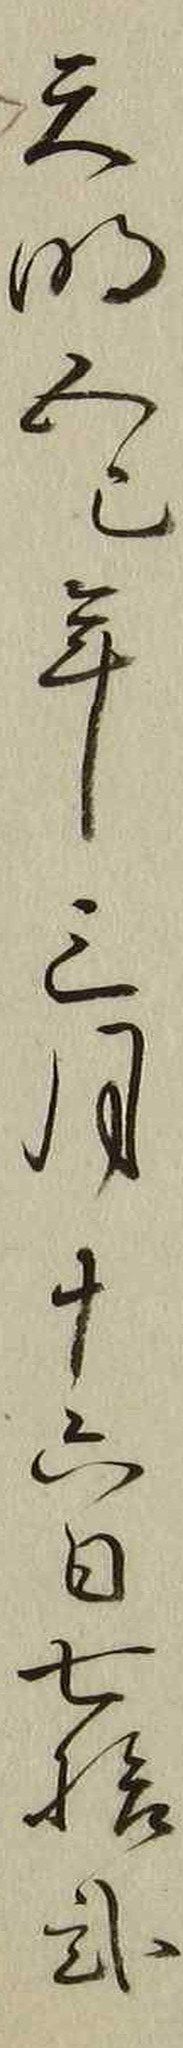天明五巳年三月十六日七拾弐
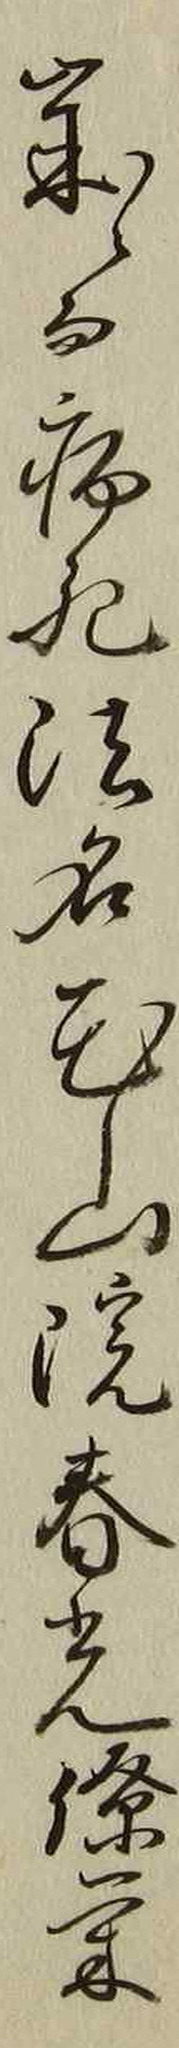歳に而病死法名花山院春光僚栄
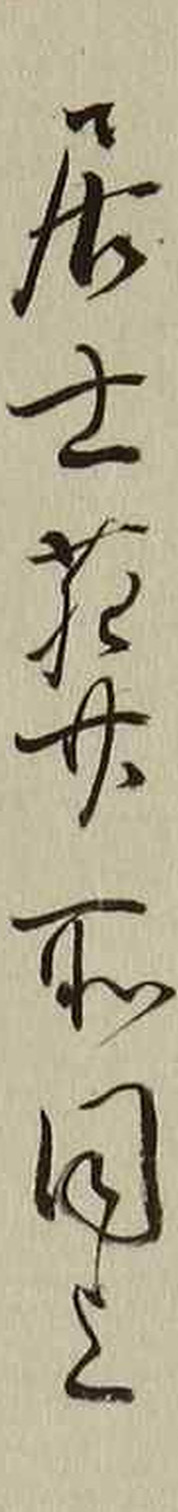居士葬所同上
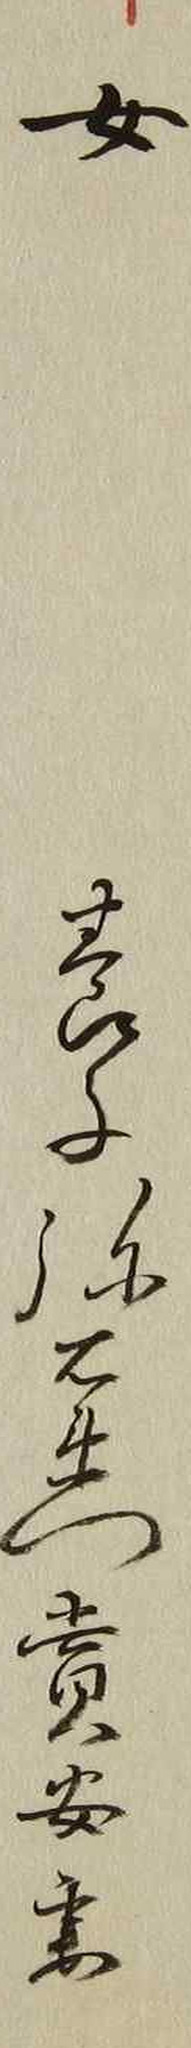女養子弥右衛門賞安妻
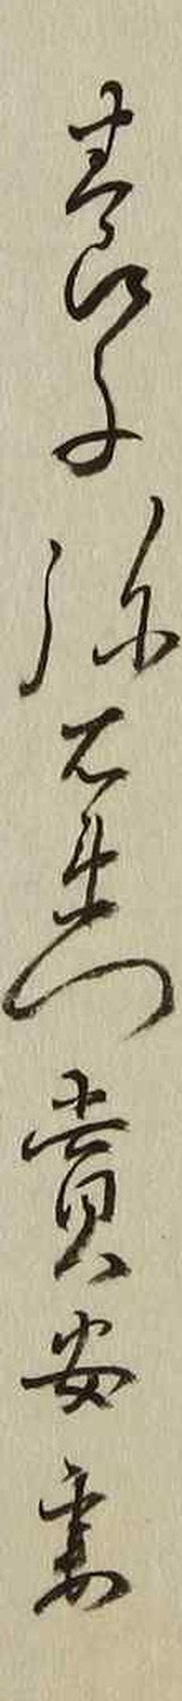女養子弥右衛門賞安妻
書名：諸士系譜　巻之6　い之部6
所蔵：会津若松市立会津図書館
